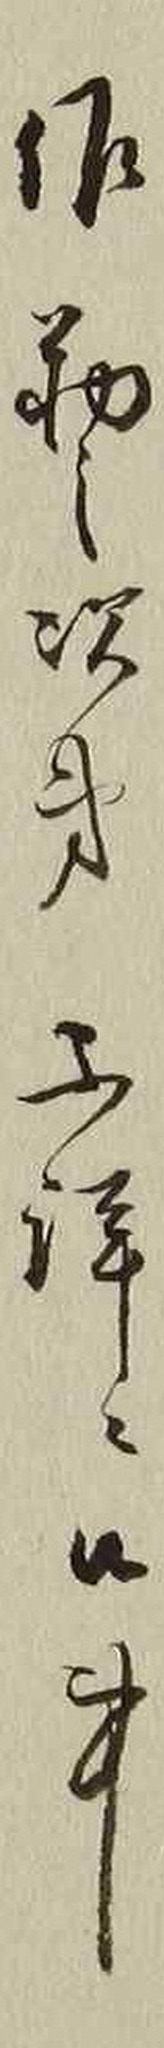作勤之次第不詳ニ候事
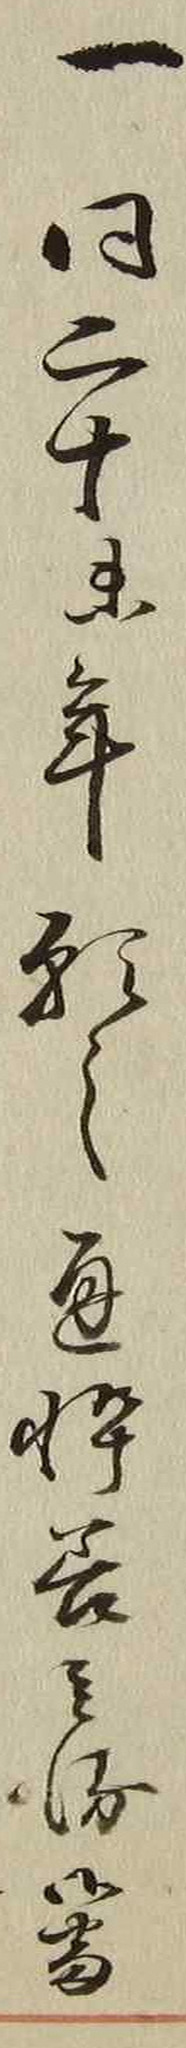一同二十未年願之通忰善兵衛御番
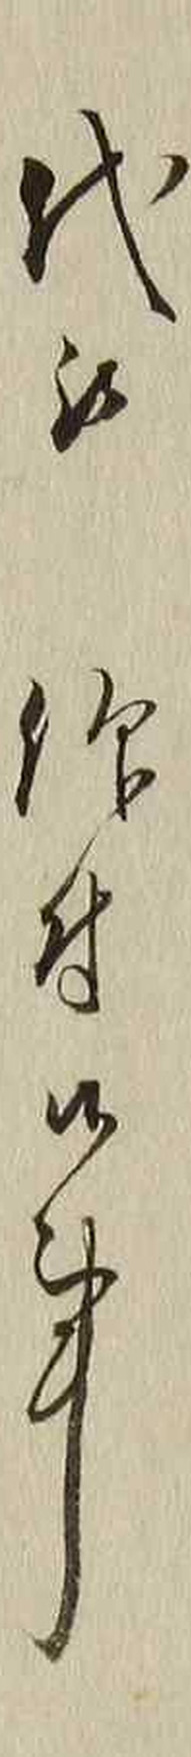代被仰付候事
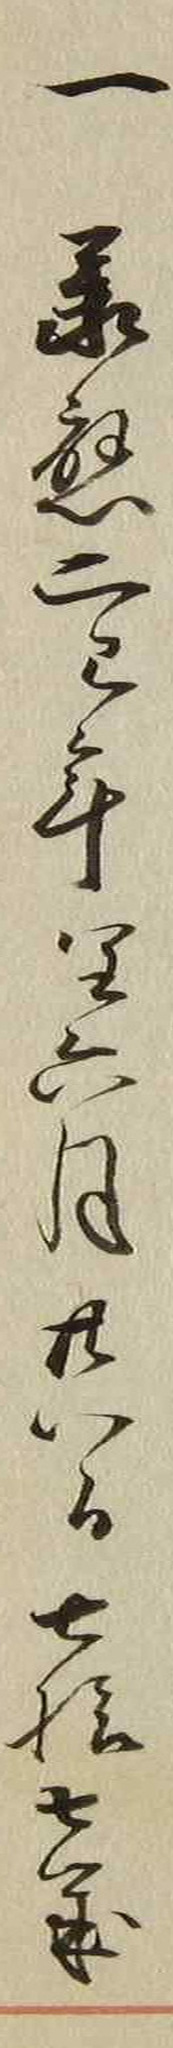一承応二巳年閏六月廿八日七拾七歳
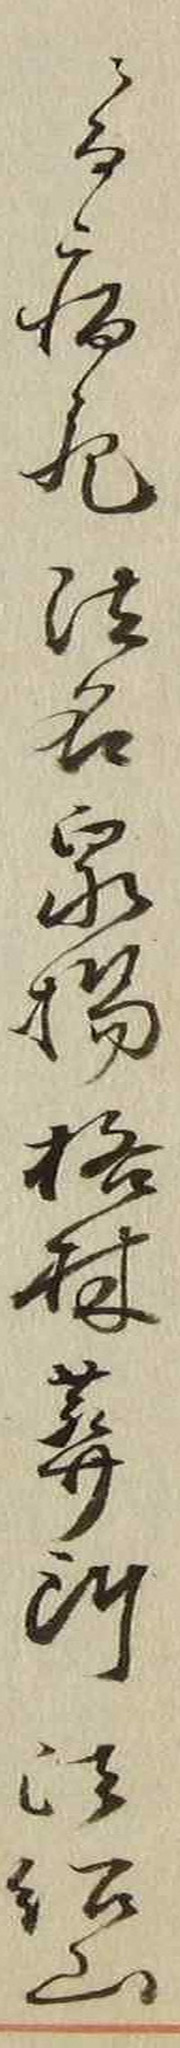ニ而病死法名泉楬梧林葬所法紹山
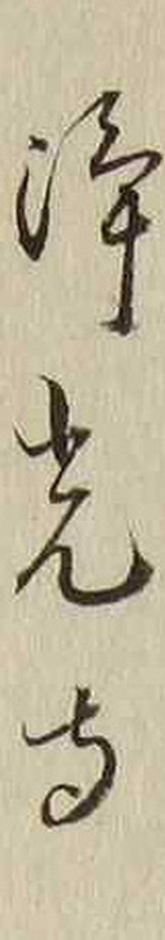浄光寺
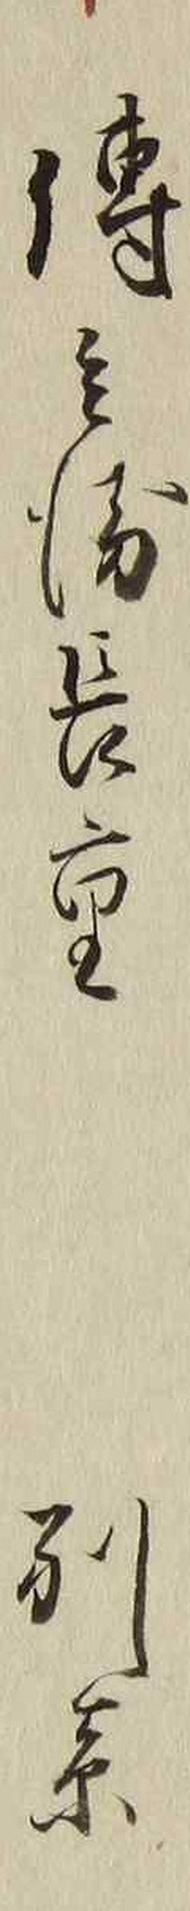伝兵衛長重別系
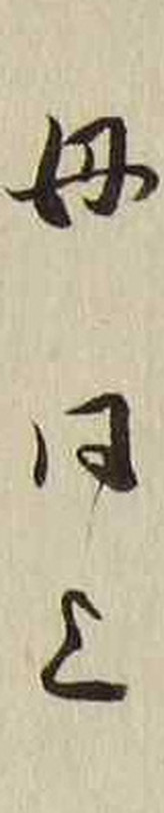母同上

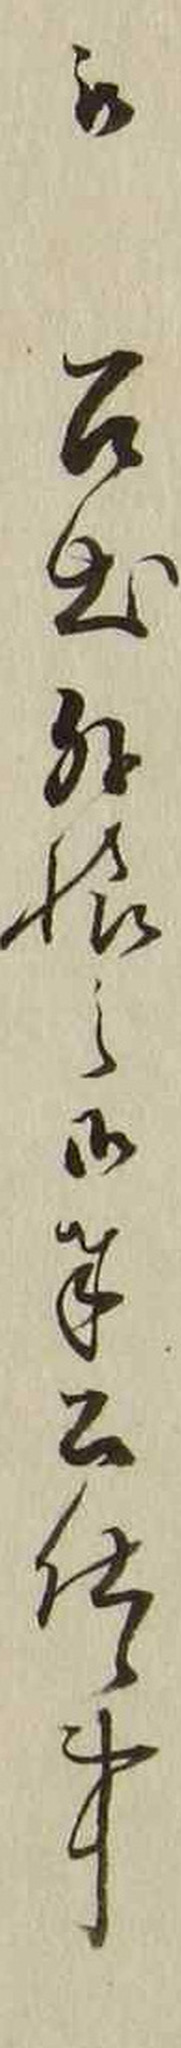被召出外様之御奉公仕候事
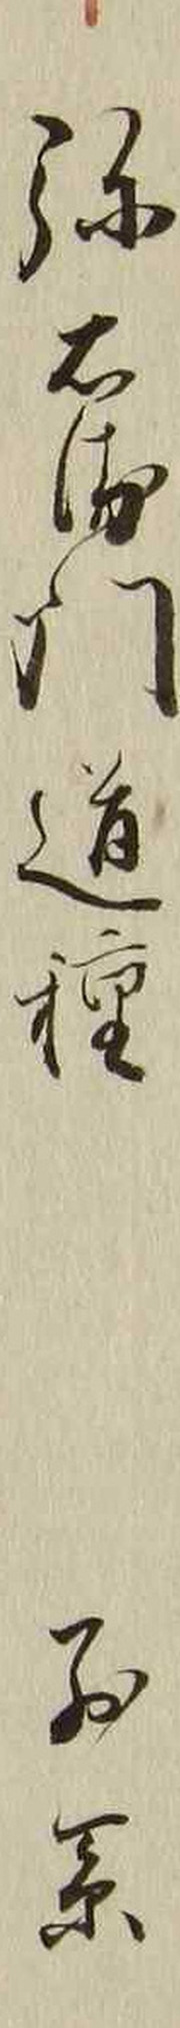孫右衛門道種別系
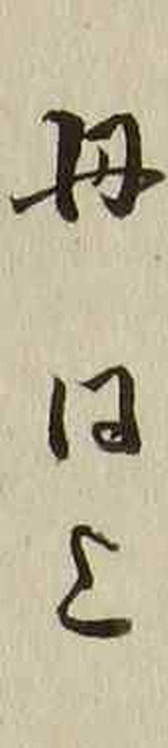母同上
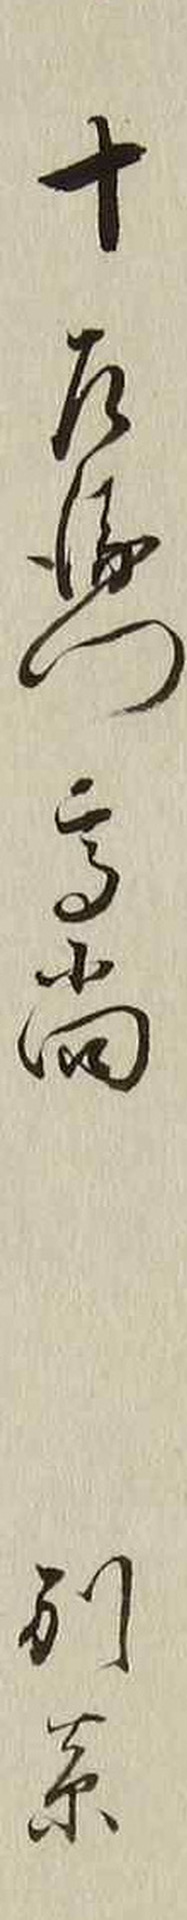十左衛門高尚別系
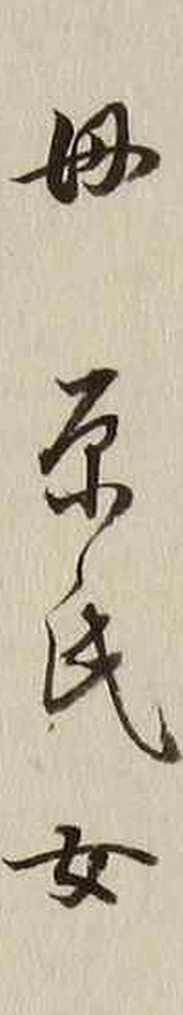母原氏女
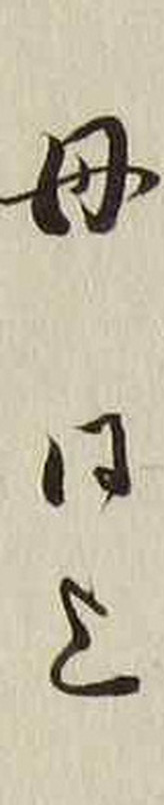母同上
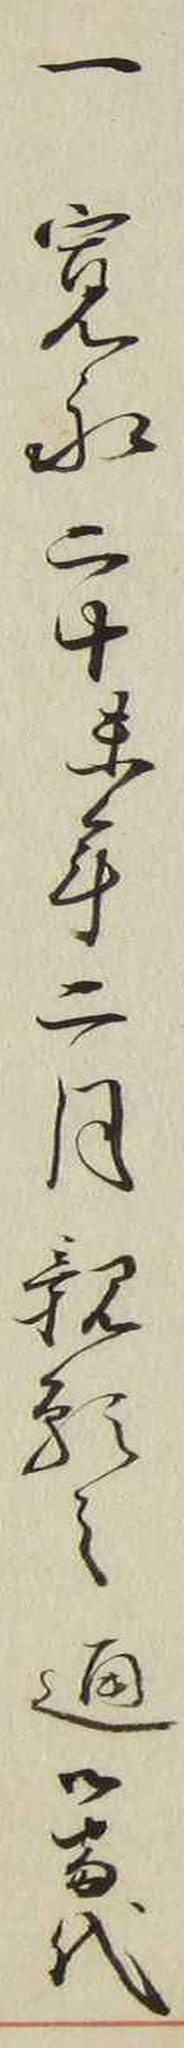一寛永二十未年二月親願之通御番代

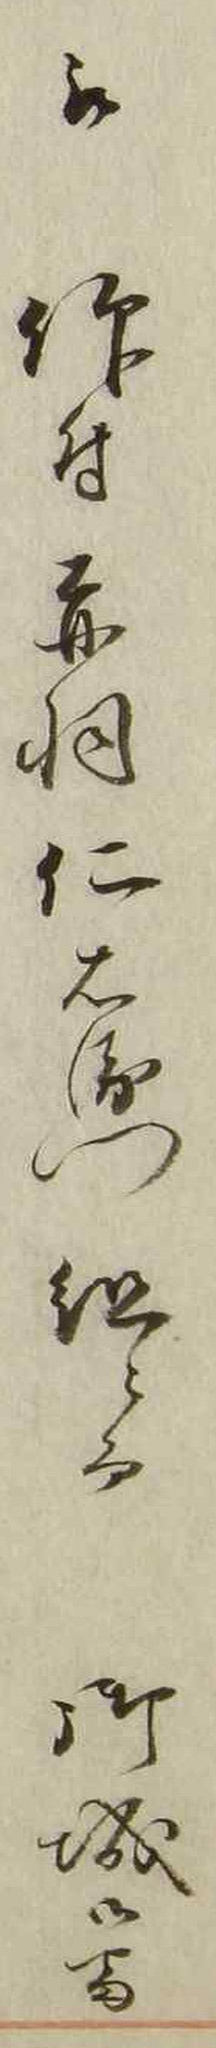被仰付赤羽仁右衛門組ニ而御城御番
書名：諸士系譜　巻之26　い之部26
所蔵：会津若松市立会津図書館
